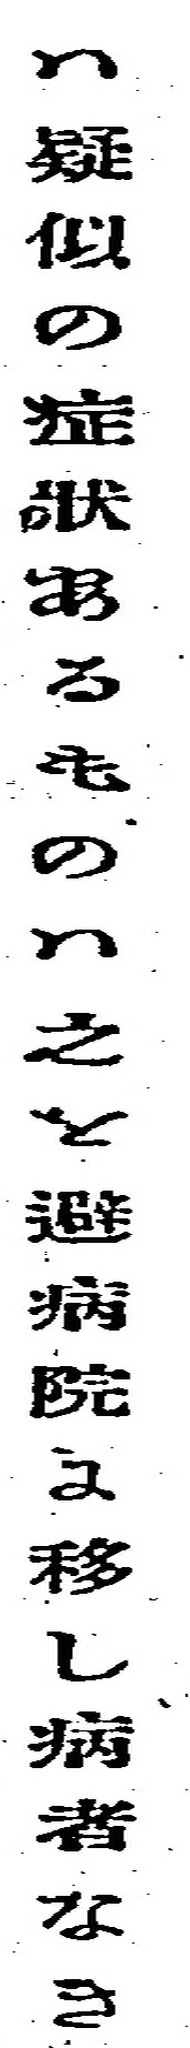は擬似の症状あるものは之を避病院に移し病者なき
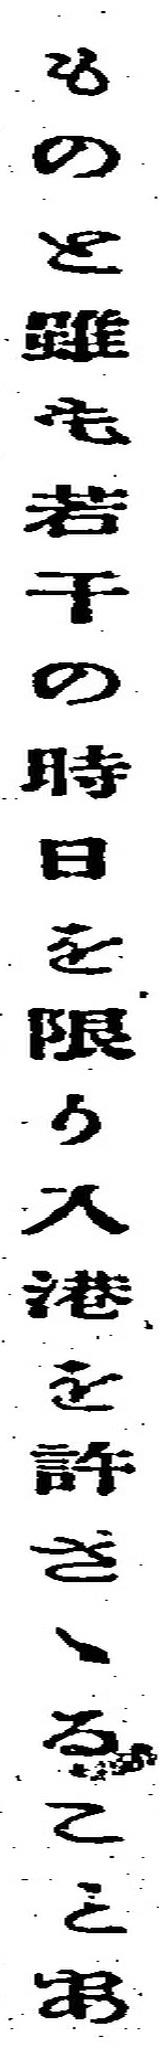ものと雖トモ若干の時日を限り入港を許さゝることあ
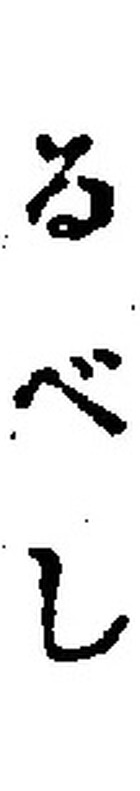るべし
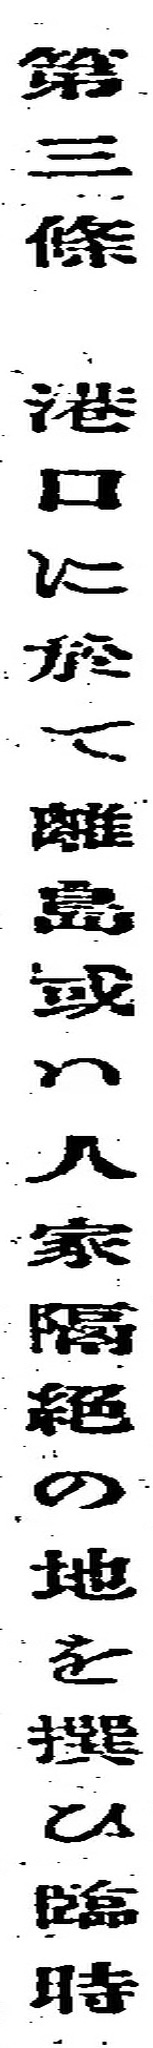第三条港口に於て離島或は人家隔絶の地を撰ひ臨時
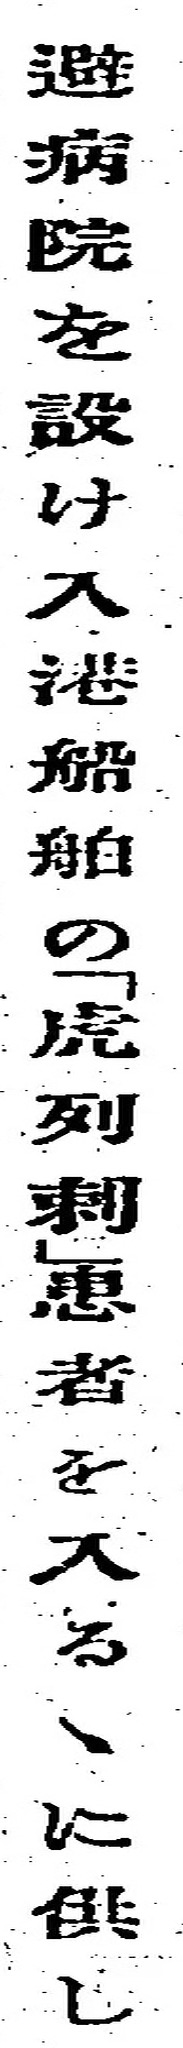避病院を設け入港船舶の「虎列刺」患者を入るゝに供し
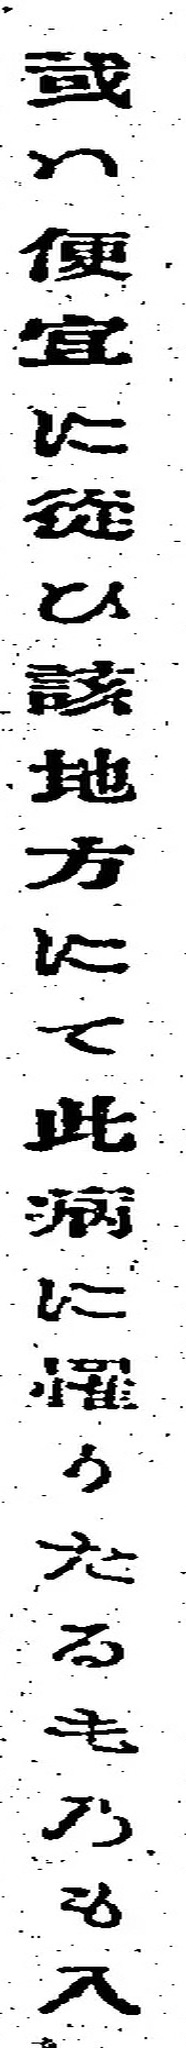或は便宜に従ひ該地方にて此病に罹りたるものも入

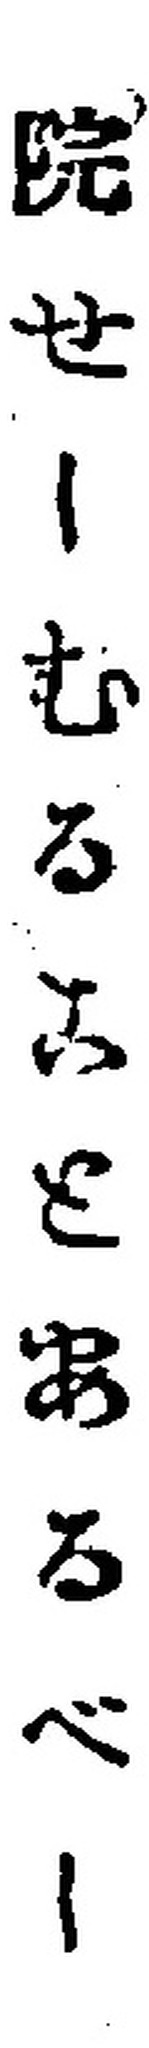院せしむることあるべし
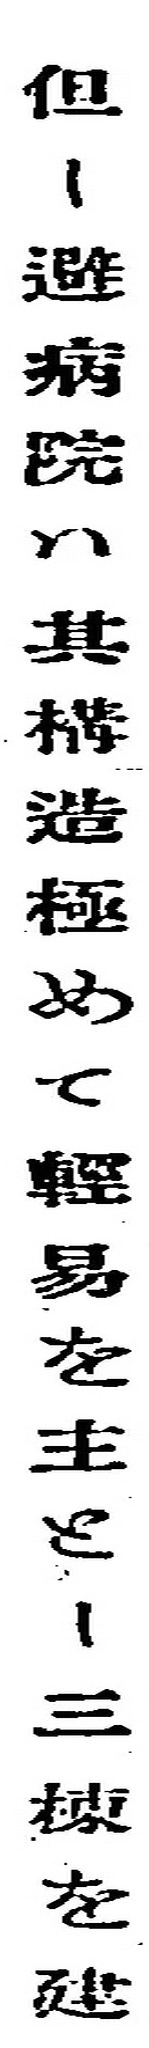但し避病院は其構造極めて軽易を主とし三棟を建
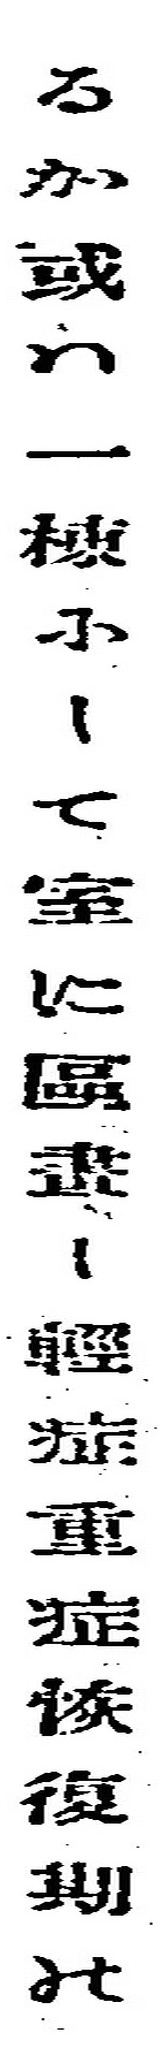るか或は一棟にして室に区画し軽症重症恢復期の
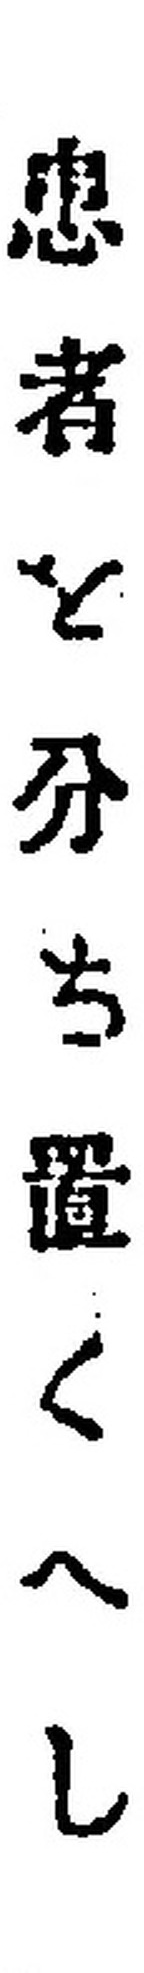患者を分ち置くへし
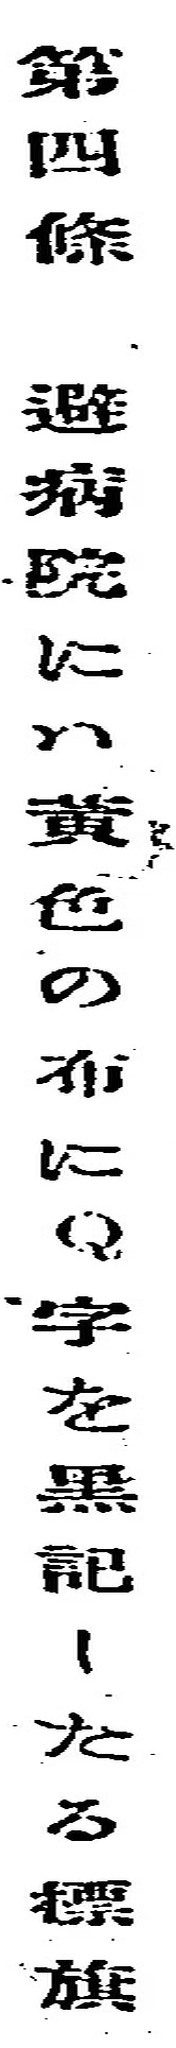第四条避病院には黄色の布にＱ字を黒記したる標旗
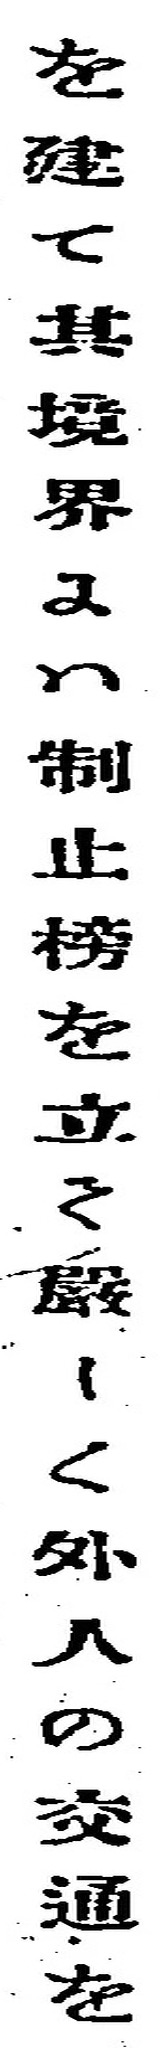を建て其境界には制止榜を立て厳しく外人の交通を
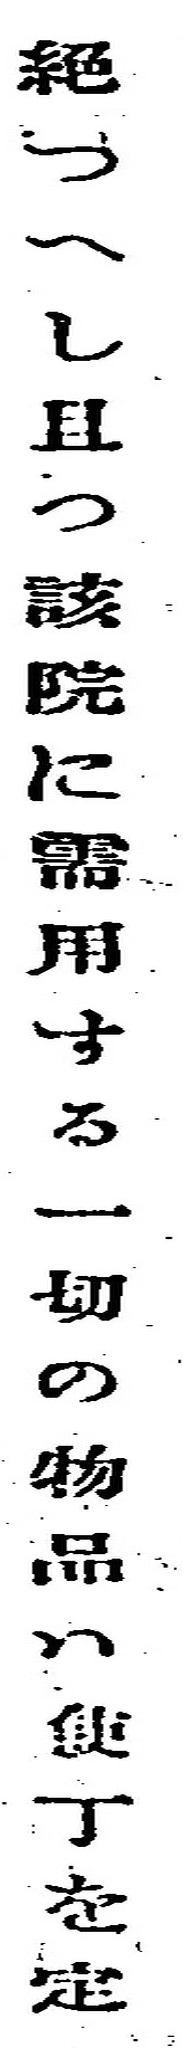絶つへし且つ該院に需用する一切の物品は使丁を定
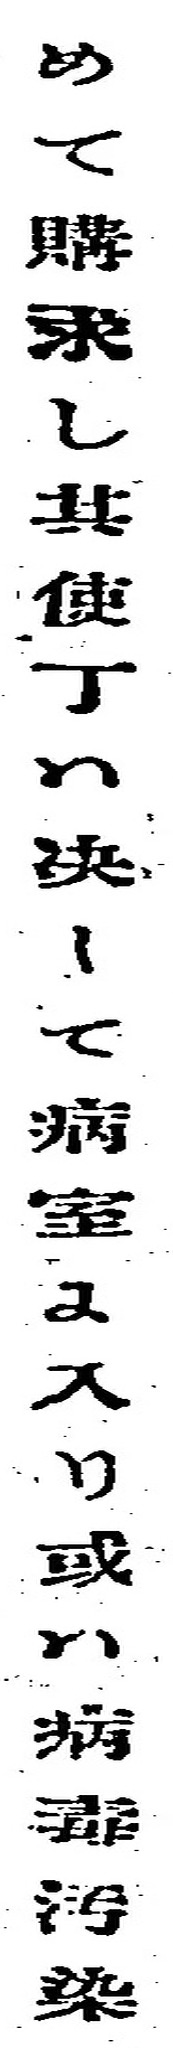めて購求し其使丁は決して病室に入り或は病毒汚染
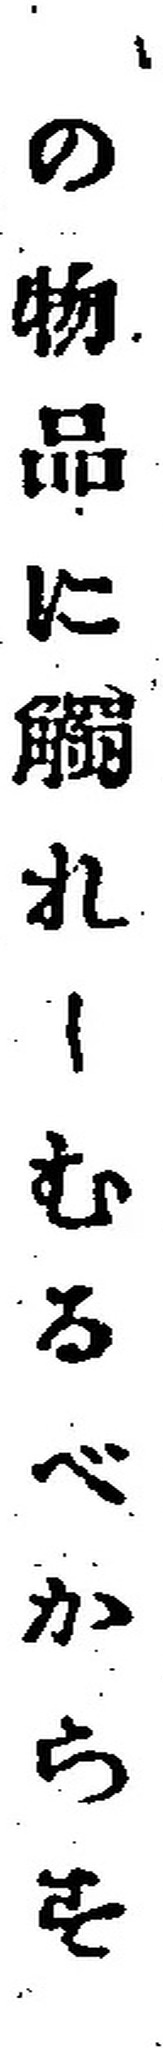の物品に触れしむるべからす
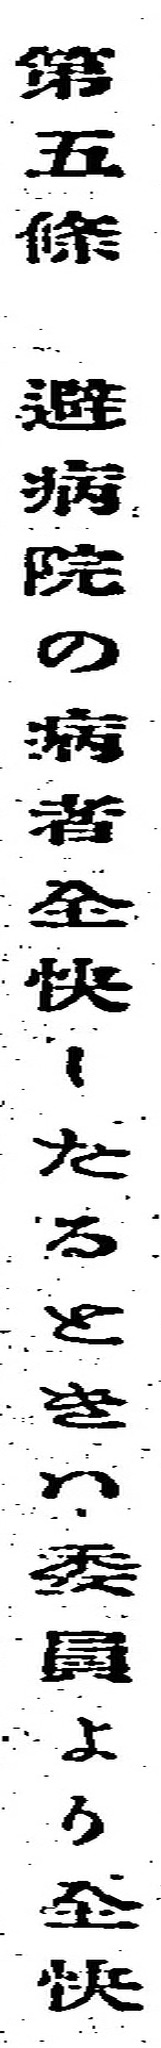第五条避病院の病者全快したるときは委員より全快
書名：これら病予防心得
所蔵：国立国会図書館 National Diet Library, JAPAN
